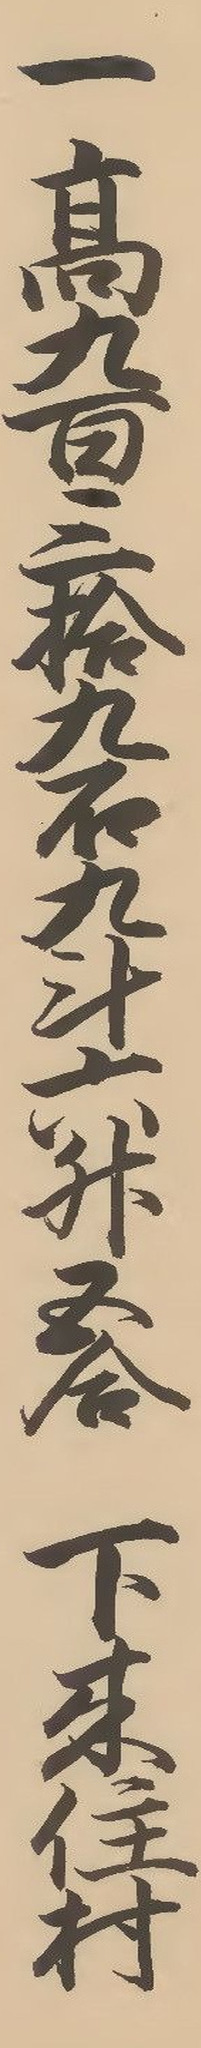一髙九百三拾九石九斗六升五合下来住村
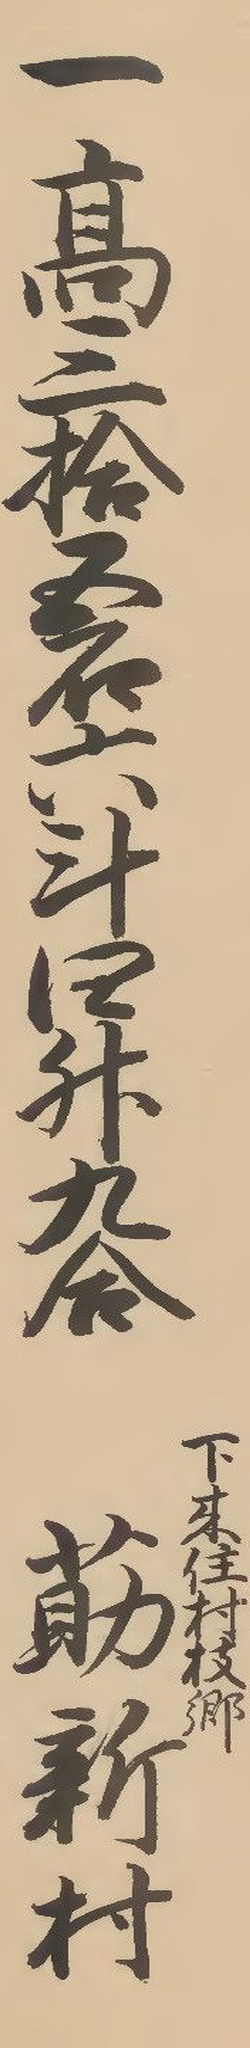一髙三拾五石六斗四升九合莇新村
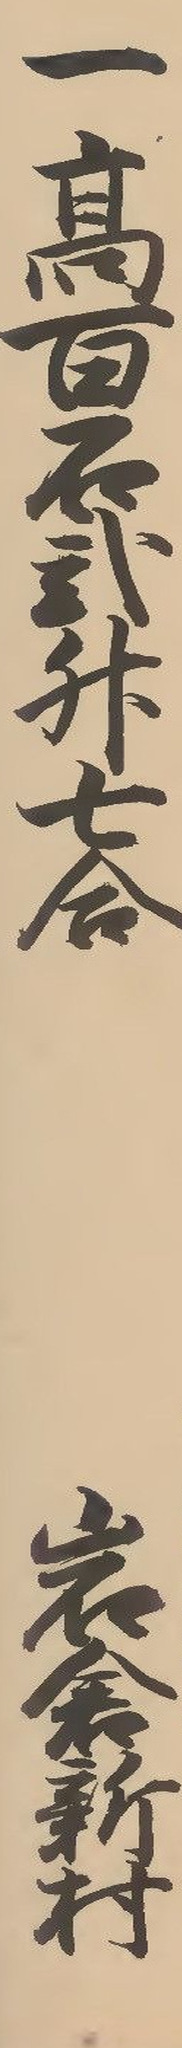一髙百石壱升七合岩倉新村
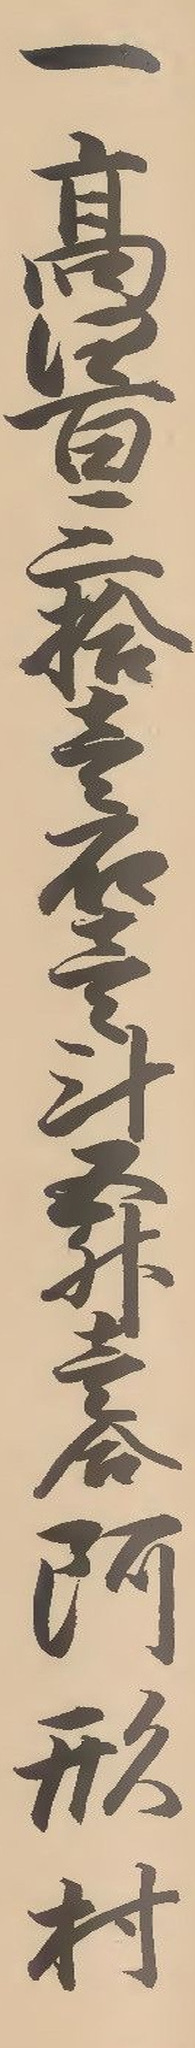一髙四百三拾壱石壱斗五升壱合阿形村
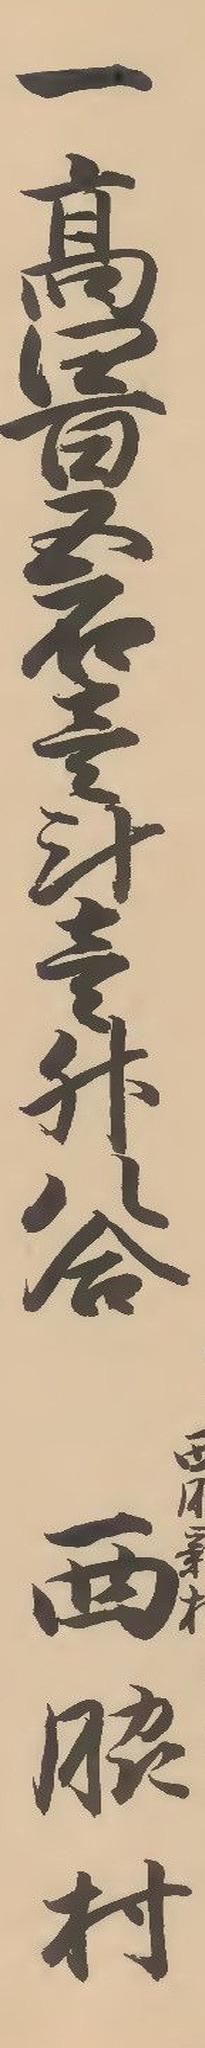一髙四百五石壱斗壱升八合西脇村
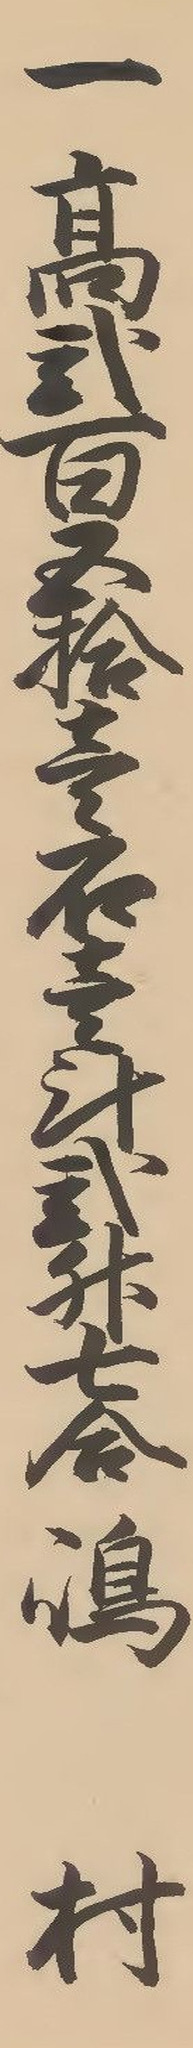一髙弐百五拾壱石壱斗弐升七合嶋村
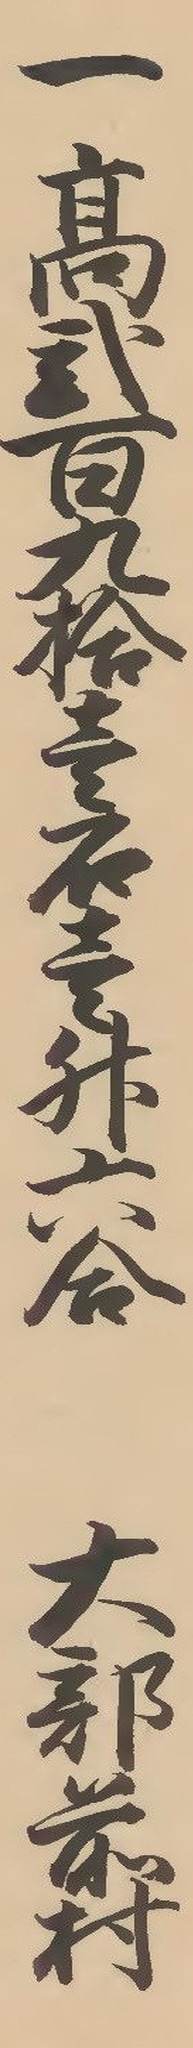一髙弐百九拾壱石壱升六合大部前村

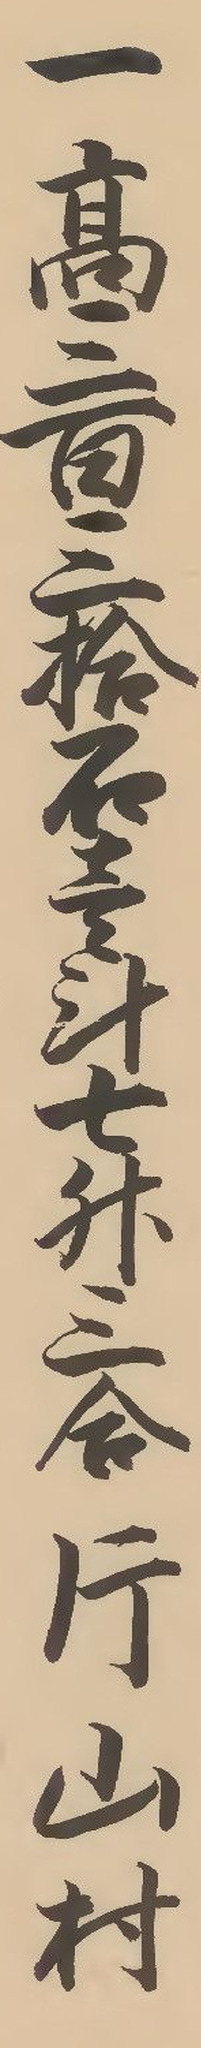一髙三百三拾石壱斗七升三合片山村
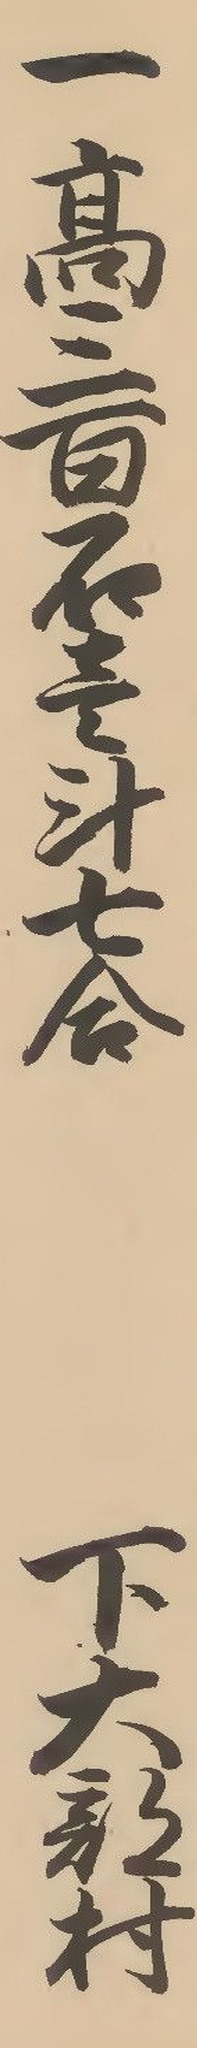一髙三百石壱斗七合下大部村
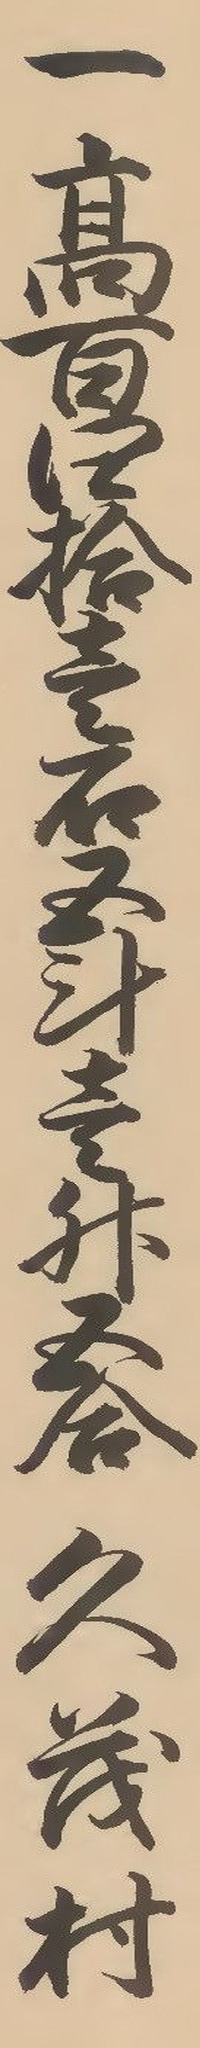一髙百四拾壱石五斗七升五合久茂村
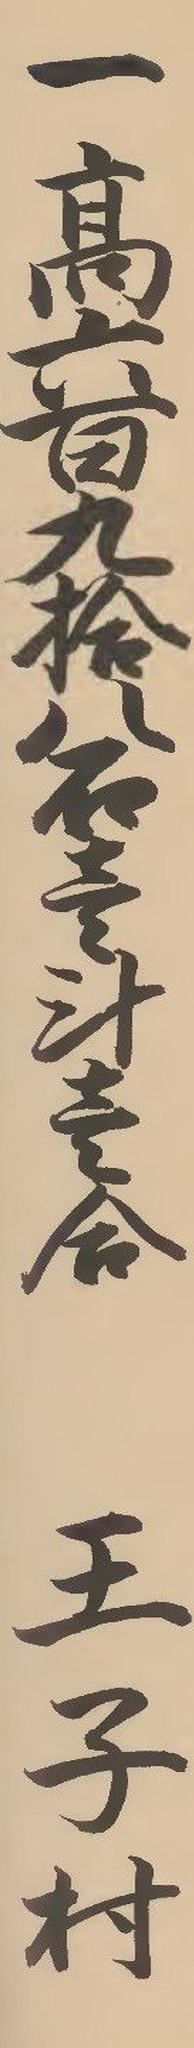一髙六百九拾八石壱斗壱合王子村
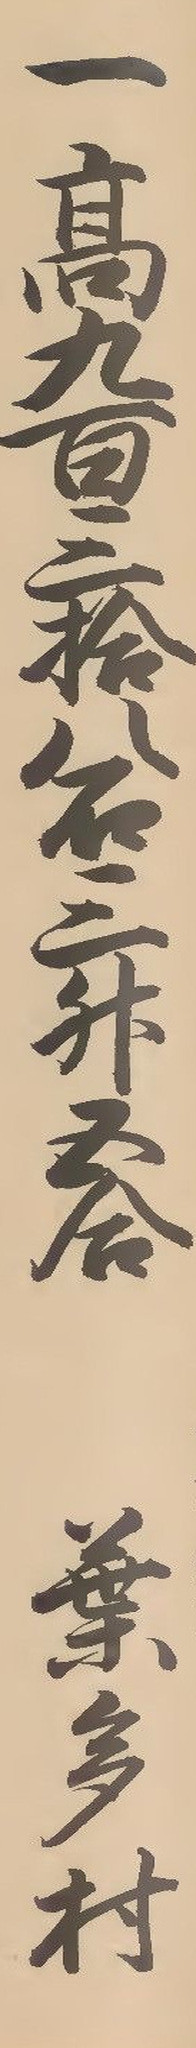一髙九百三拾八石三升五合葉多村
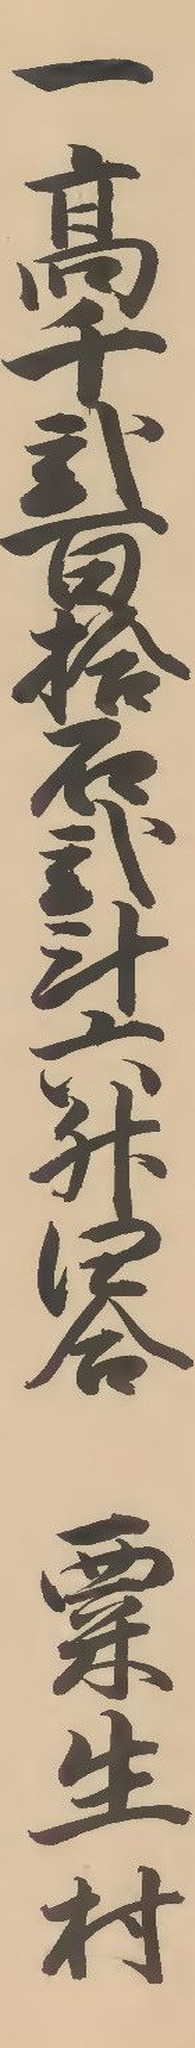一髙千弐百拾石弐斗六升四合粟生村
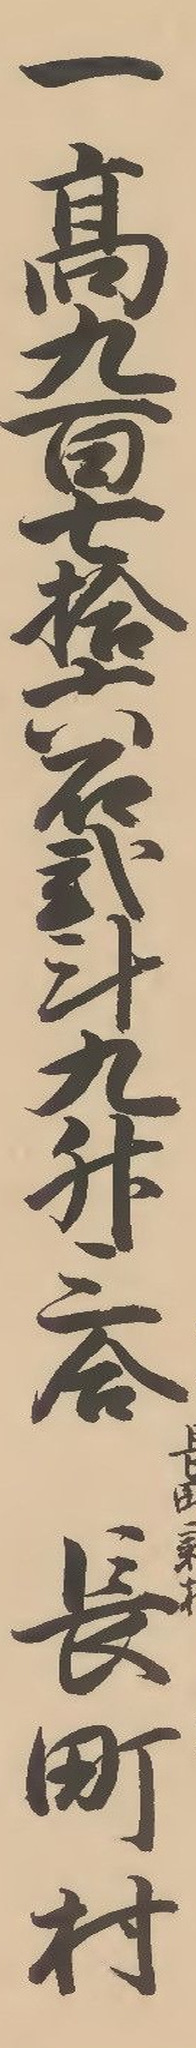一髙九百七拾六石弐斗九升三合長町村
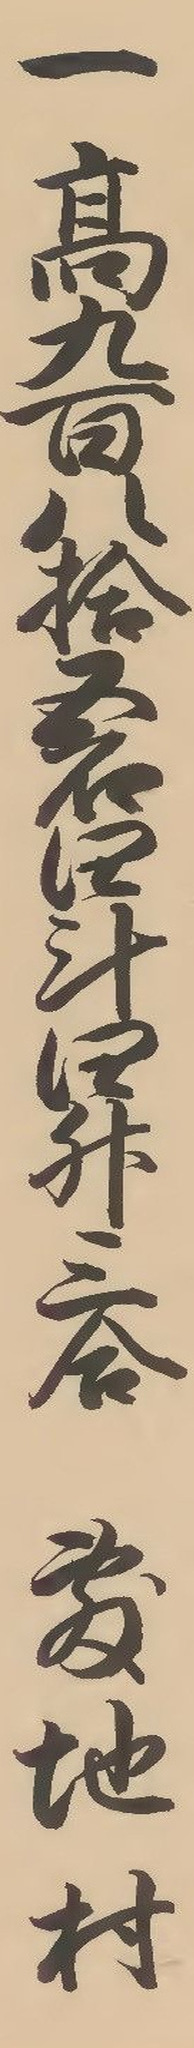一髙九百八拾五石四斗四升三合敷地村

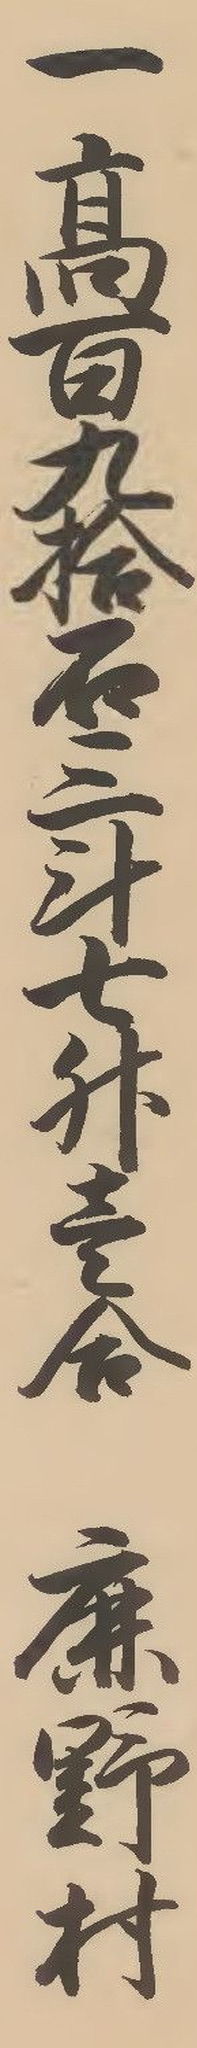一髙百九拾石三斗七升壱合鹿野村
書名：播磨国郷帳
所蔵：国立公文書館 National Archives of Japan
